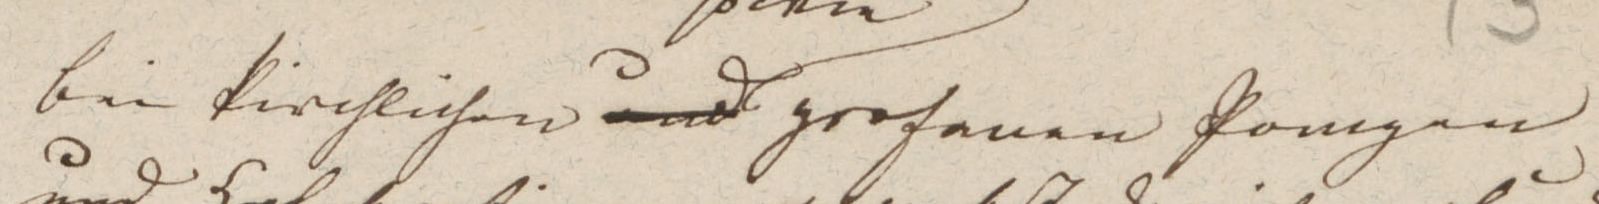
bei kirchlichen und sowie profanen Pompen
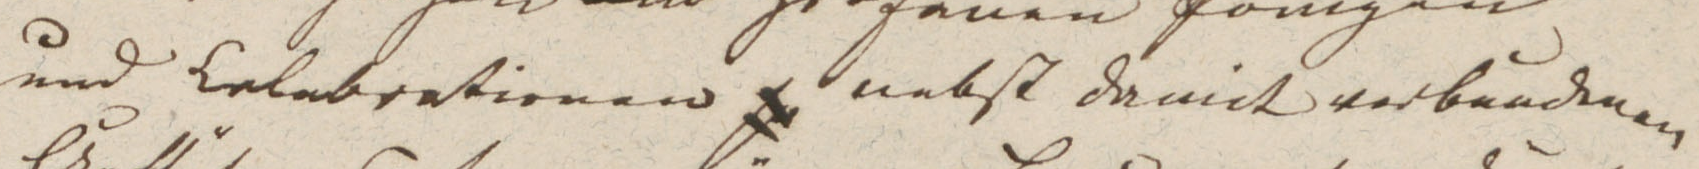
und Celebrationen s nebst damit verbundenen
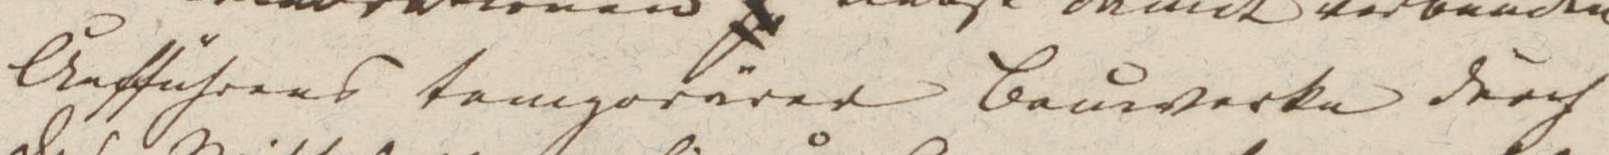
Aufführens temporärer Bauwerke durch
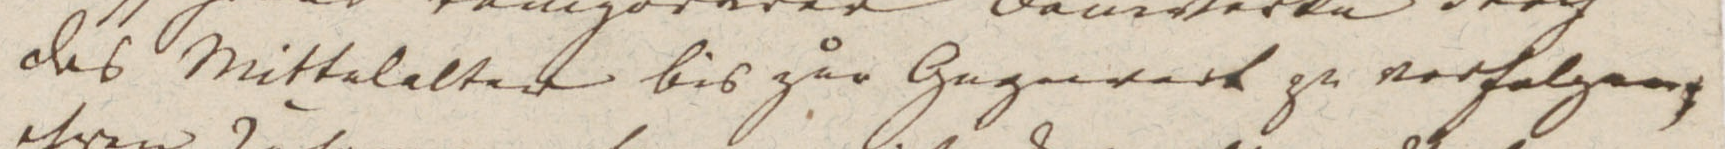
das Mittelalter bis zur Gegenwart zu verfolgen;,
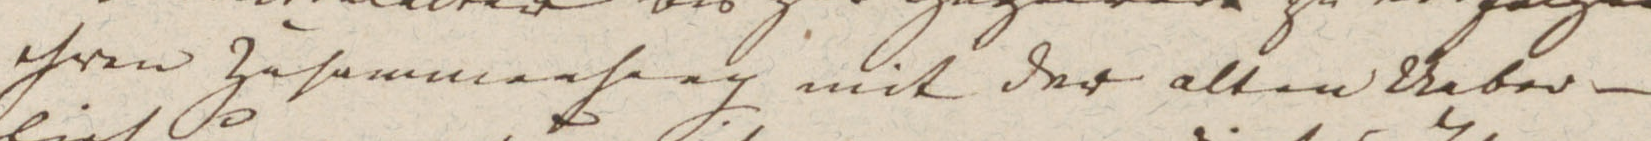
ihren Zusammenhang mit der alten Ueber-
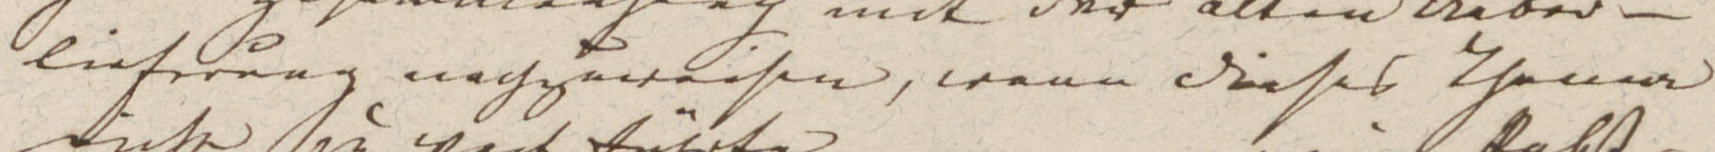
lieferung nachzuweisen, wenn dieses Thema
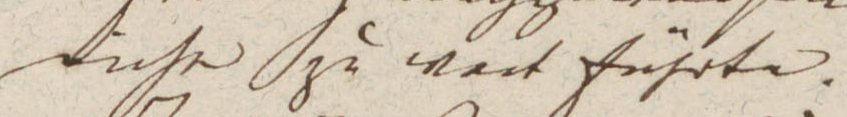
nicht zu weit führte.
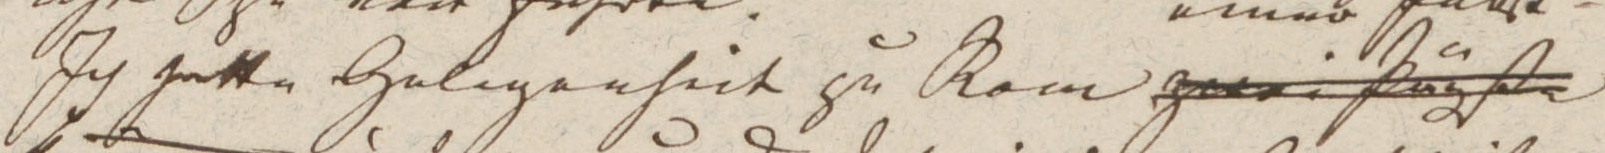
Ich hatte Gelegenheit zu Rom zwei Päpste
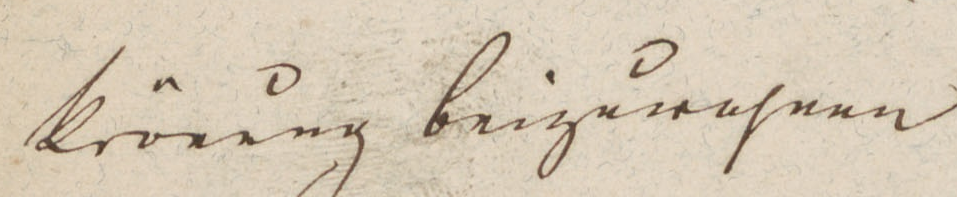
krönung beizuwohnen
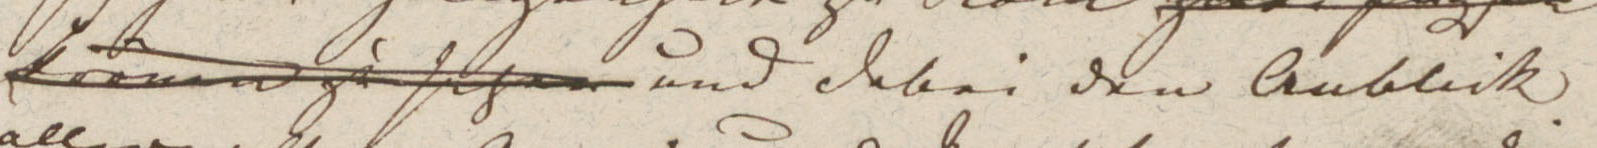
krönen zu sehen und dabei den Anblick
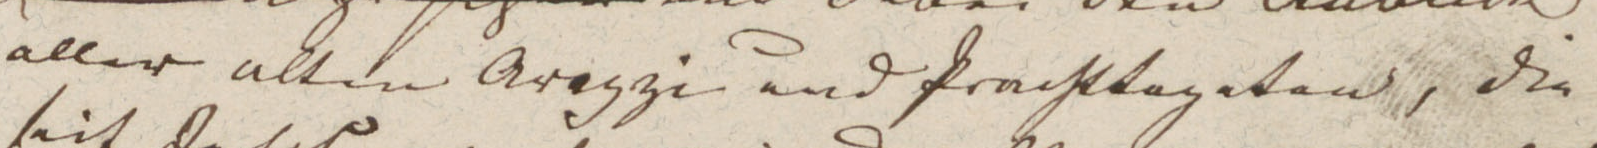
aller alten Arazzi und Prachttapeten, die
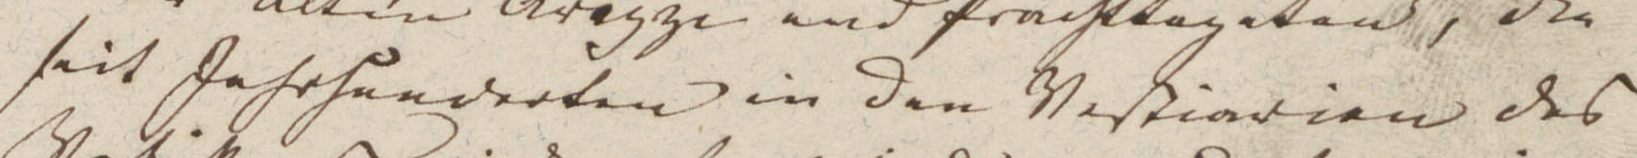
seit Jahrhunderten in den Vestiarien des
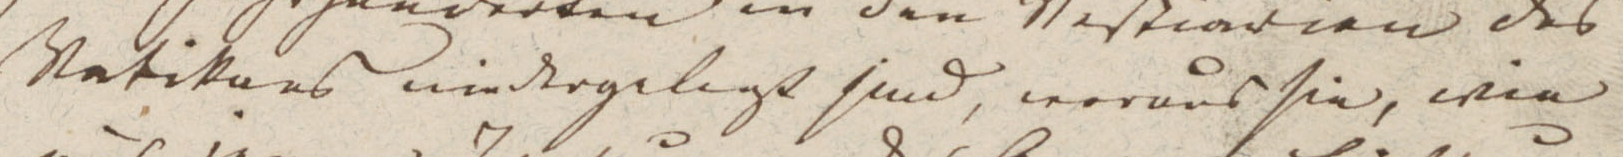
Vatikans niedergelegt sind, woraus sie, wie
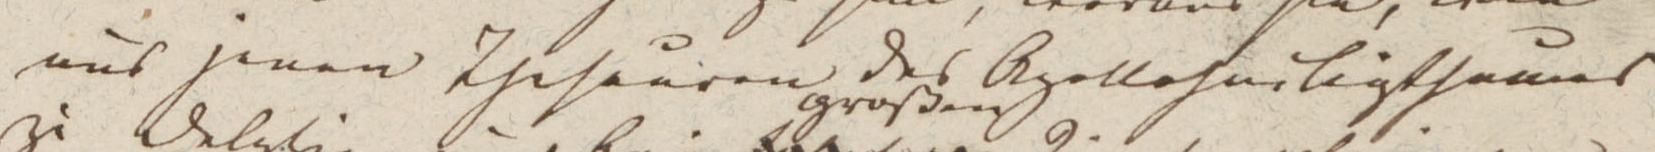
aus jenen Thesauren des Apolloheiligthumes
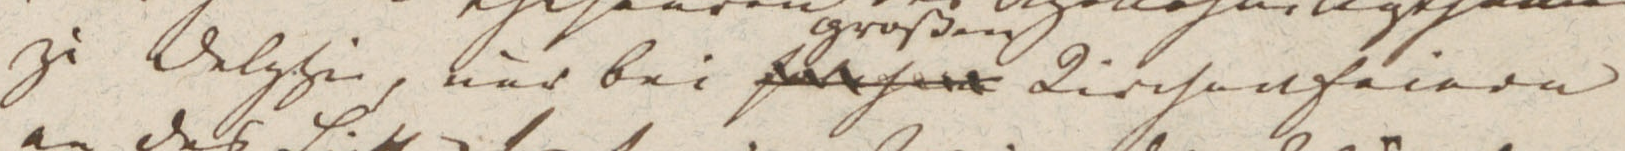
zu Delphi, nur bei solchen grossen Kirchenfeiern
